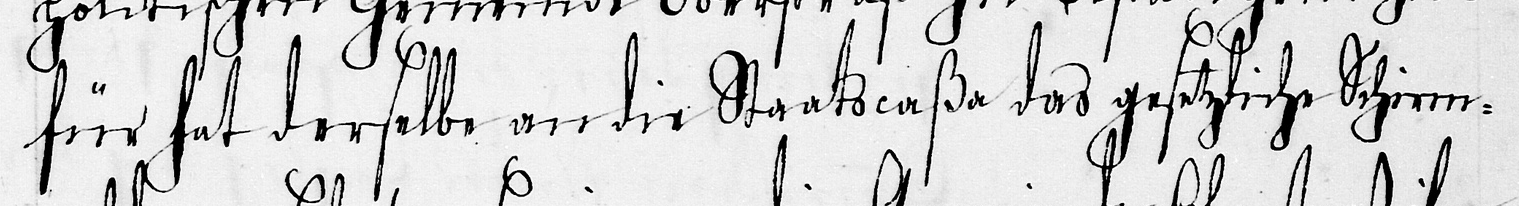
für hat derselbe an die Staatscaßa das gesetzliche Schirm¬
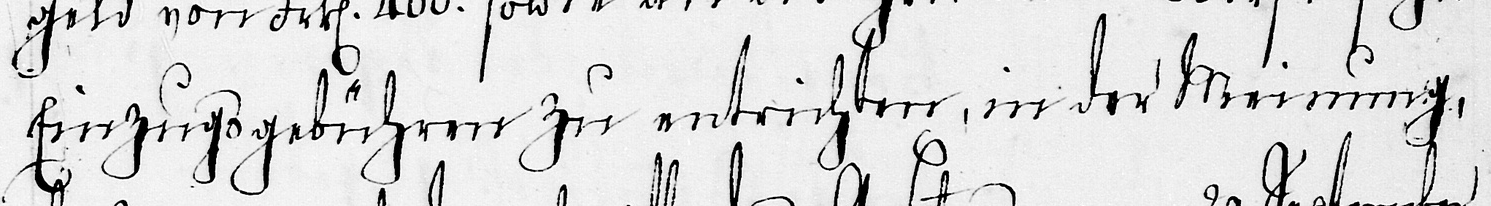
Einzugsgebühren zu entrichten, in der Meinung,
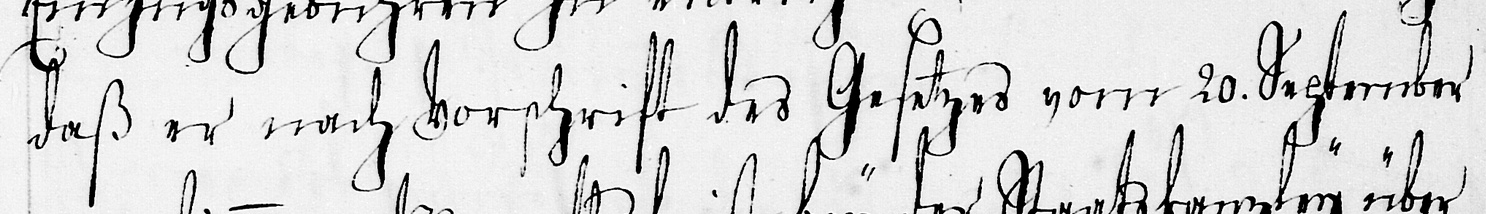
daß er nach Vorschrift des Gesetzes vom 20. September
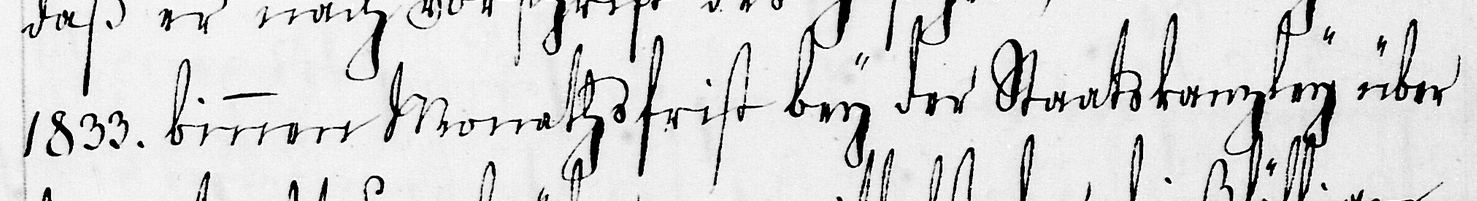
1833. binnen Monathsfrist bey der Staatskanzley über
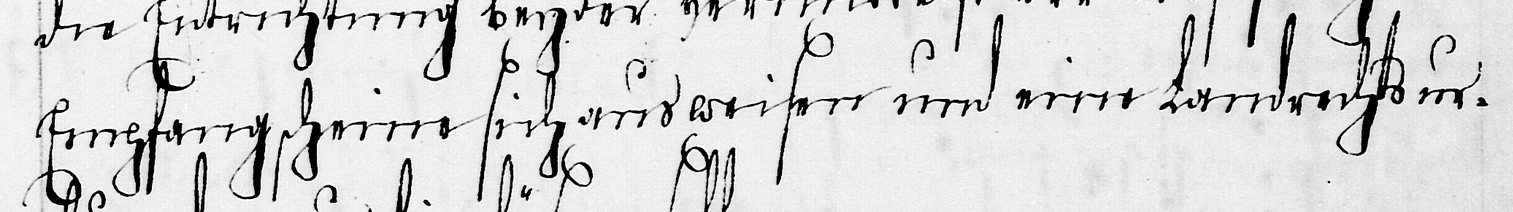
Empfangscheine sich ausweisen und eine Landrechtsur¬
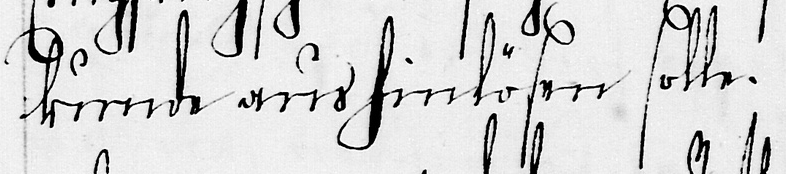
kunde aushinlösen solle.
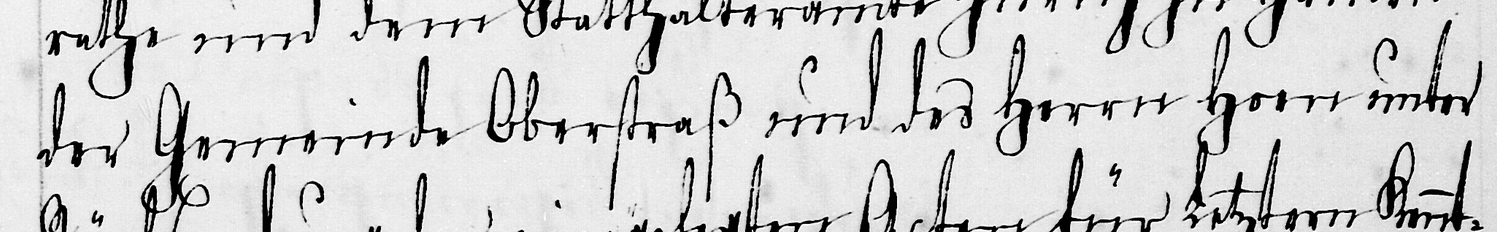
der Gemeinde Oberstraß und des Herrn Hoen unter
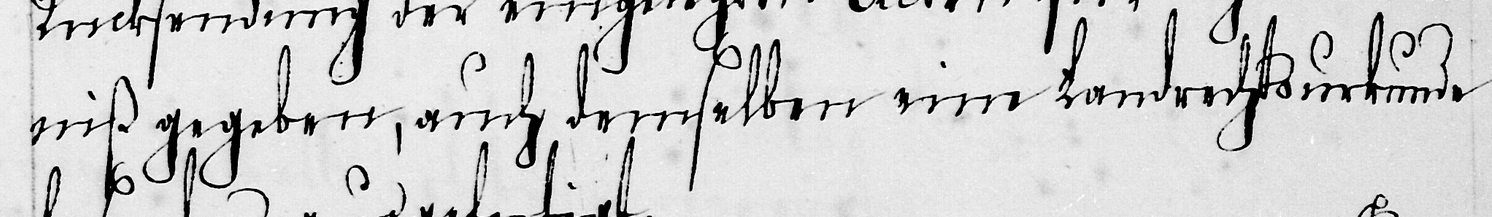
tniß gegeben, auch demselben eine Landrechtsurkunde
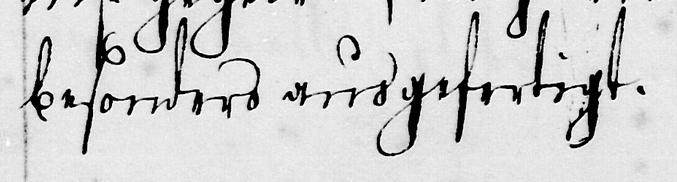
besonders ausgefertigt.
